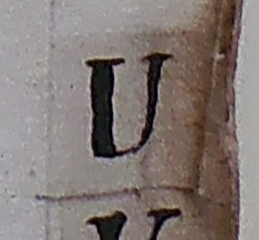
U
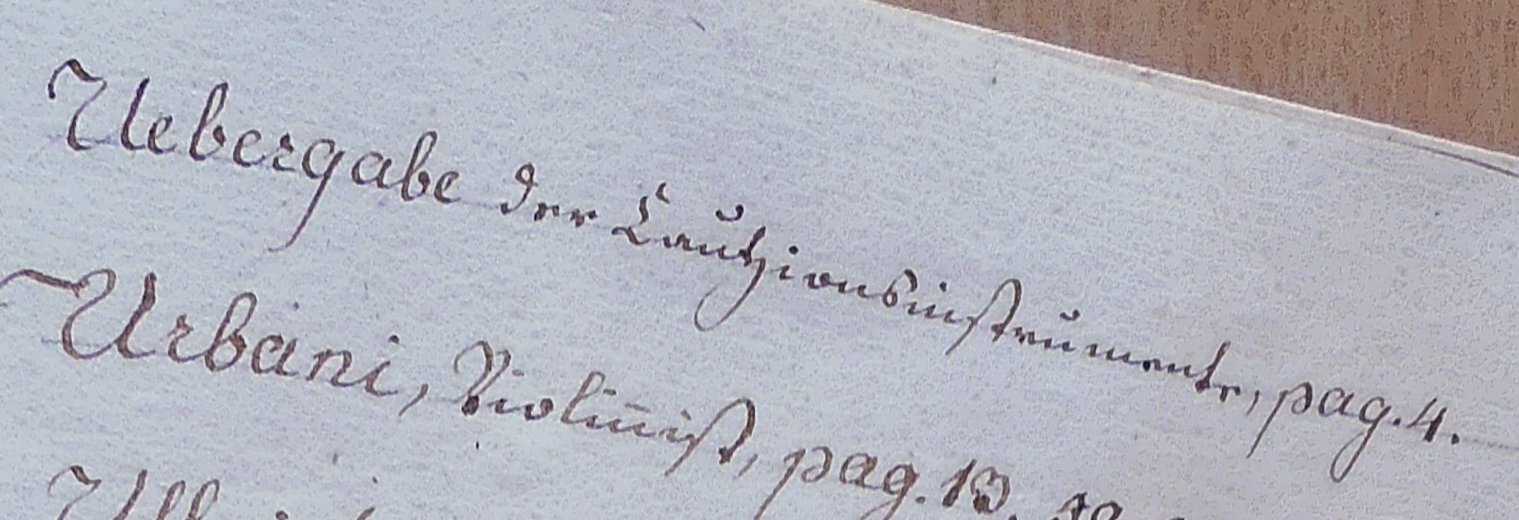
Uebergabe der Cautzionsinstrumente, pag. 4.
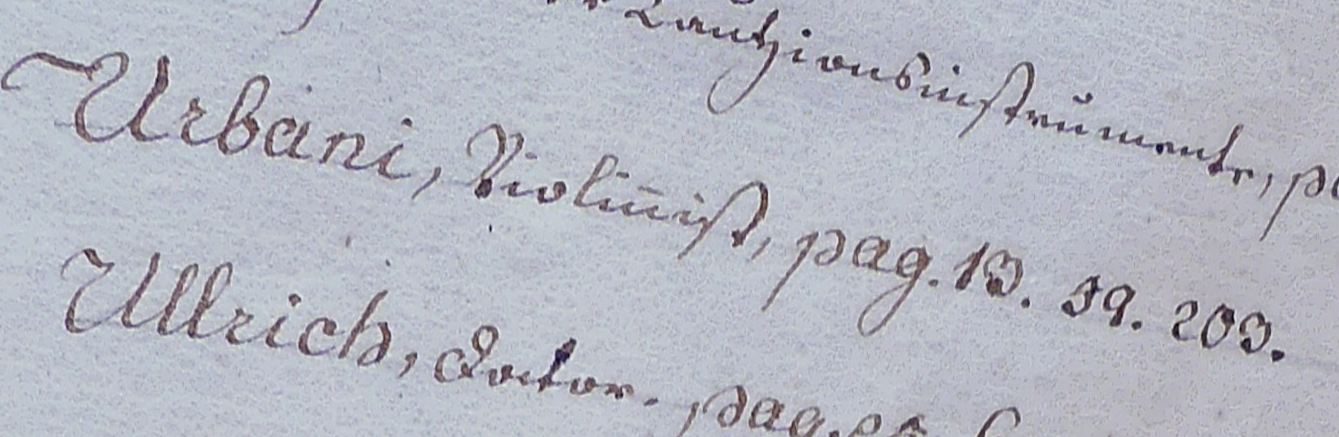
Urbani, Violinist, pag. 13. 59. 203.
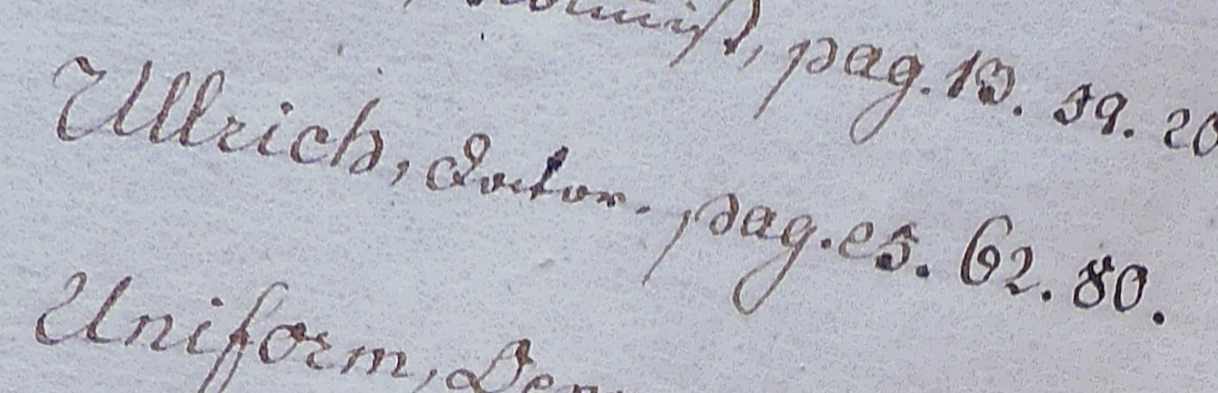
Ullrich, Doctor, pag. 25. 62. 80.
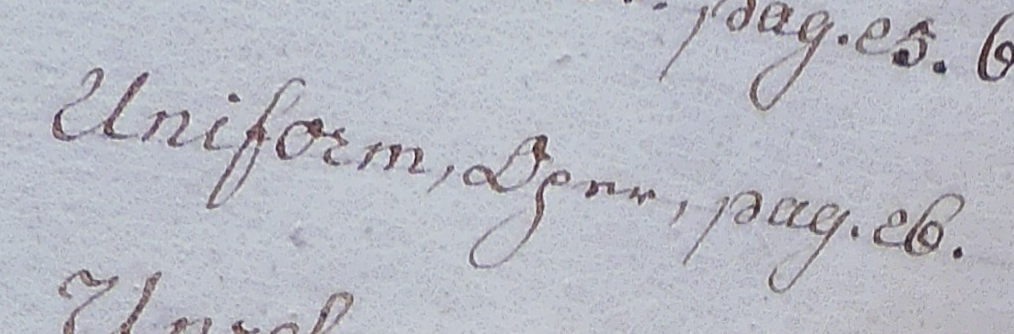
Uniform, Oper, pag. 26.
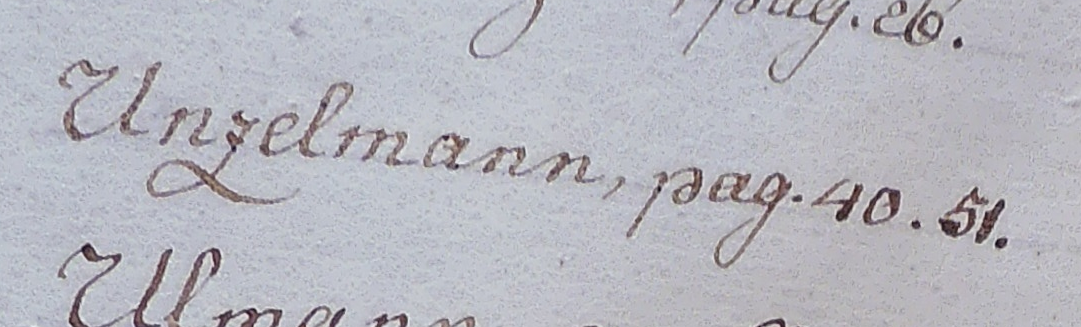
Unzelmann, pag. 40. 51.
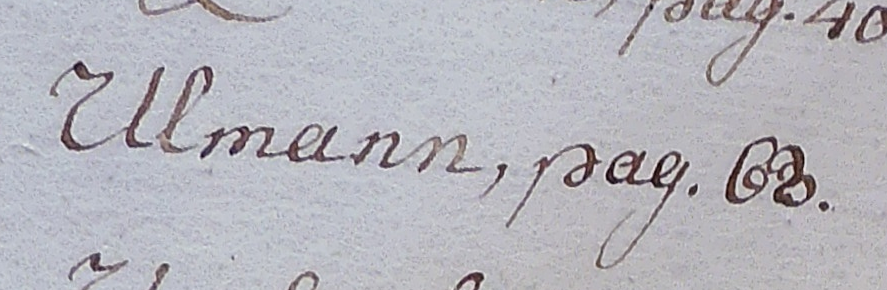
Ulmann, pag. 63.
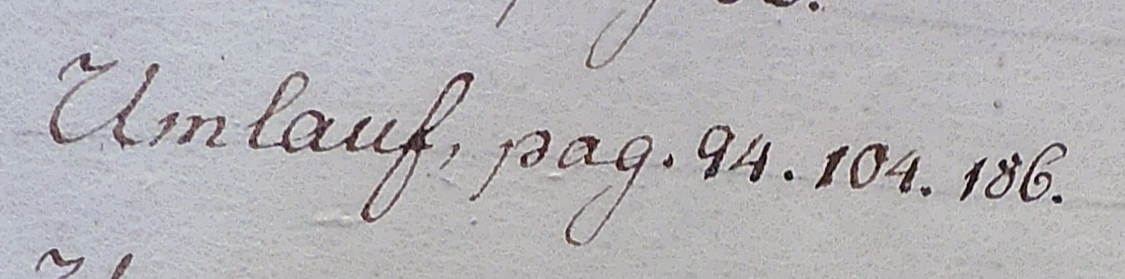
Umlauf, pag. 94. 104. 186.
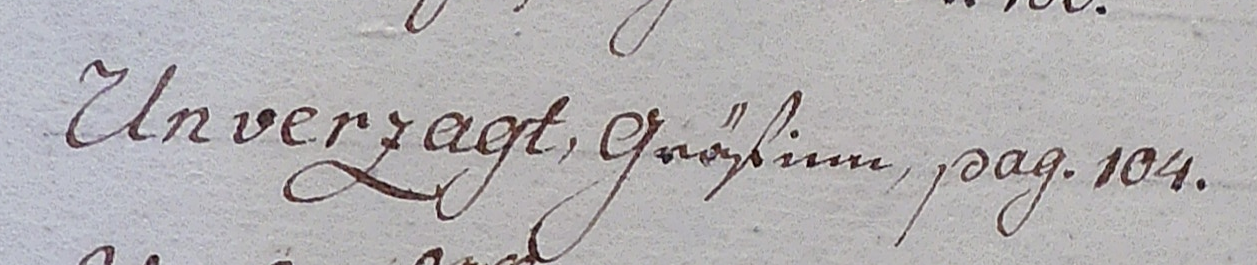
Unverzagt, Gräfinn, pag. 104.
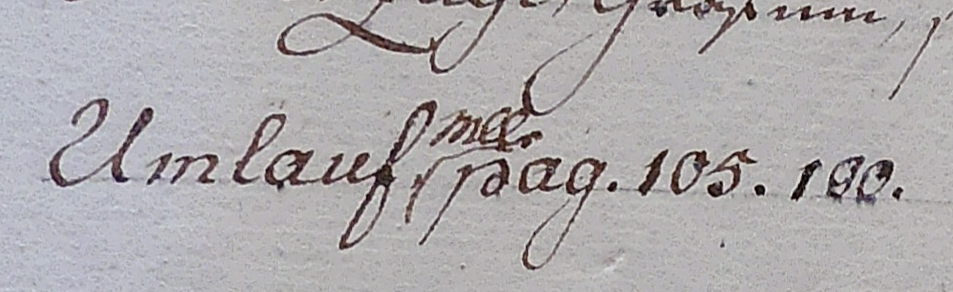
Umlauf. Mlle pag. 105. 190.
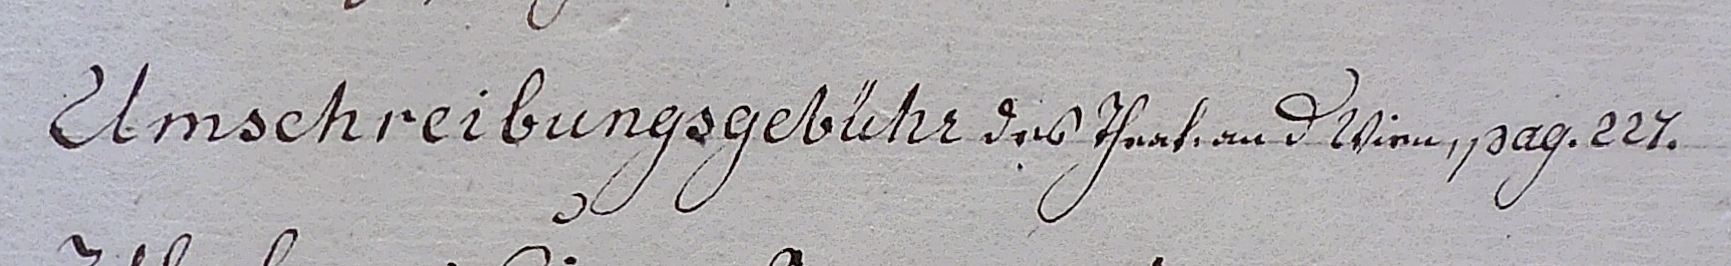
Umschreibungsgebühr des Theater an der Wien, pag. 227.
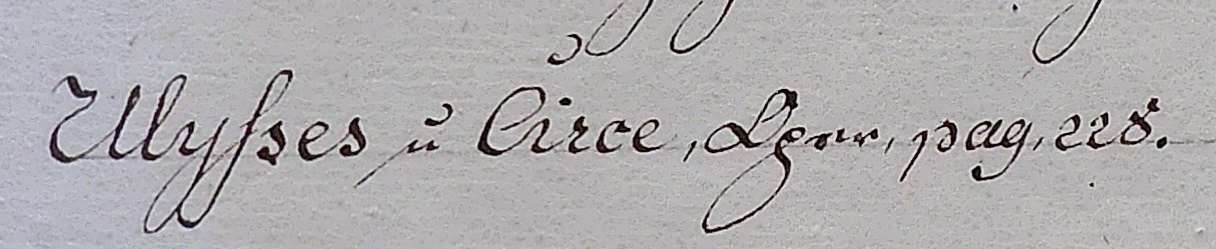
Ulysses u Circe, Oper, pag. 228.
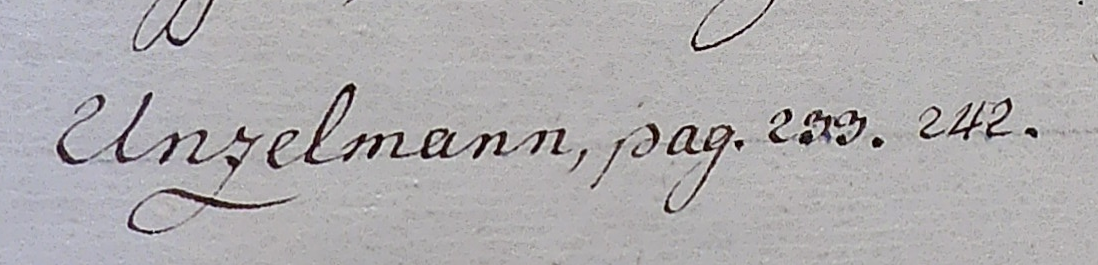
Unzelmann, pag. 233. 242.
